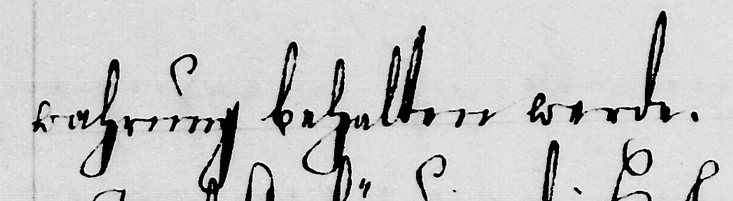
wahrung behalten werde.
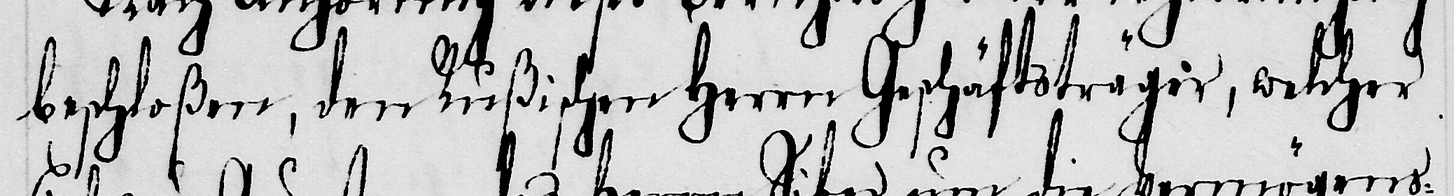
beschloßen, den Rußischen Herrn Geschäftsträger, welcher
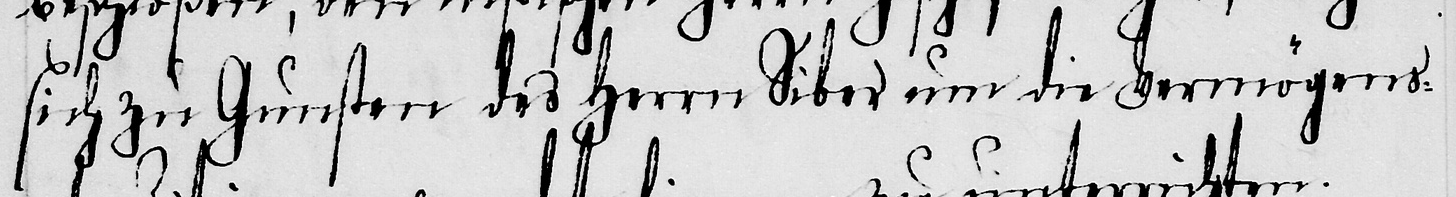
sich zu Gunsten des Herrn Siber um die Vermögens¬
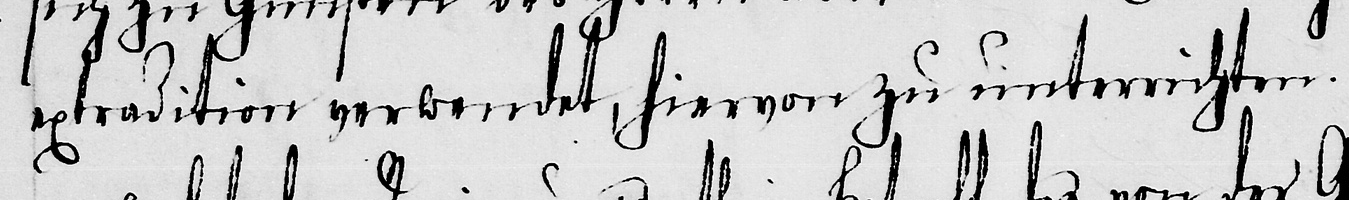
extradition verwendet, hiervon zu unterrichten.
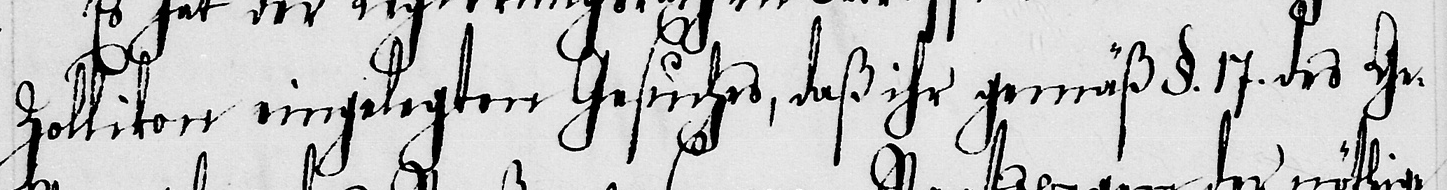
Zollikon eingelegten Gesuches, daß ihr gemäß §. 17. des Ge¬
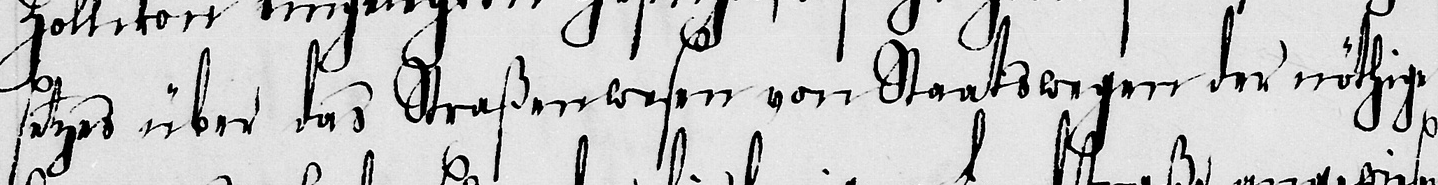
setzes über das Straßenwesen von Staatswegen der nöthige
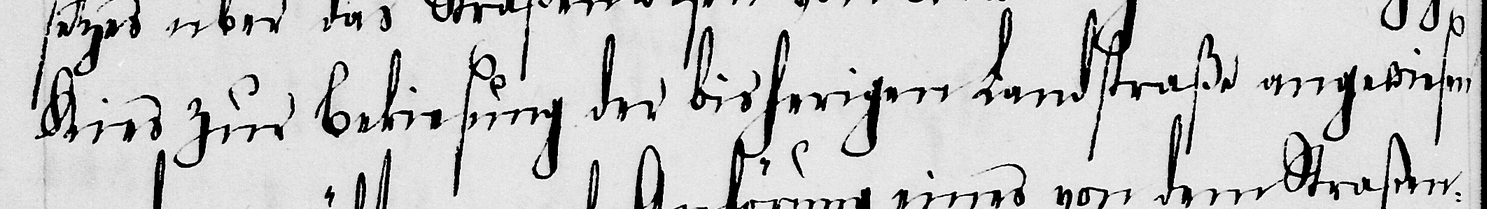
Kies zur Bekiesung der bisherigen Landstraße angewiesen
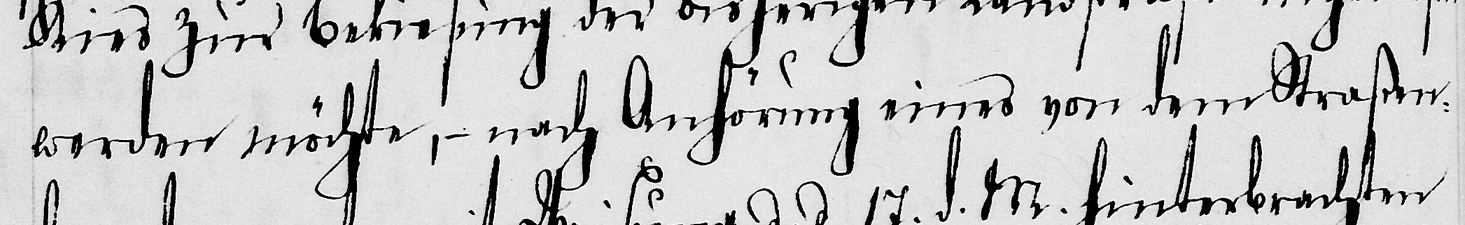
werden möchte, – nach Anhörung eines von dem Straßen¬
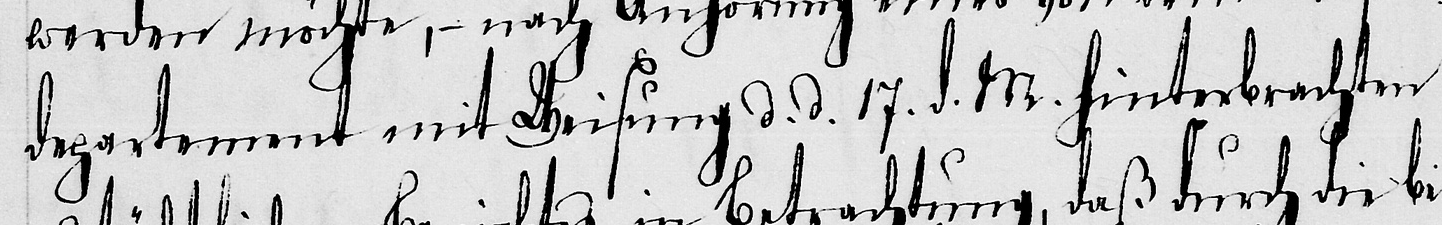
departement mit Weisung d. d. 17. d. M. hinterbrachten
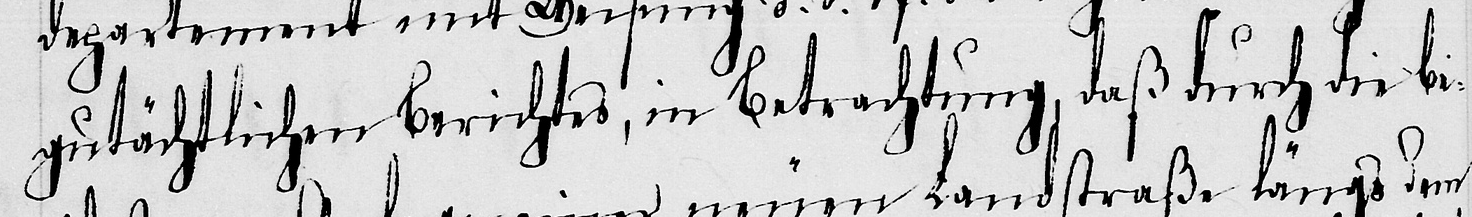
gutächtlichen Berichtes, in Betrachtung, daß durch die b¬
